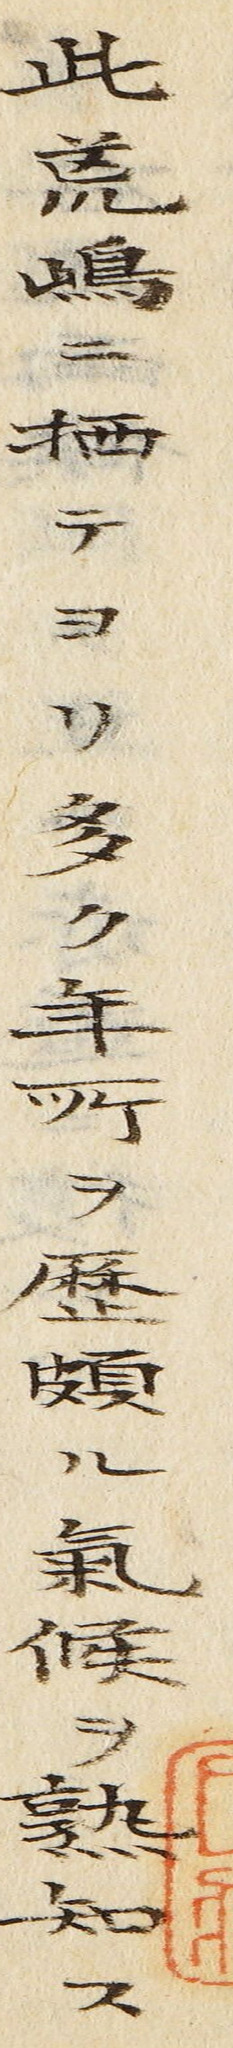此荒島ニ拪テヨリ多ク年所ヲ歴頗ル気候ヲ熟知ス
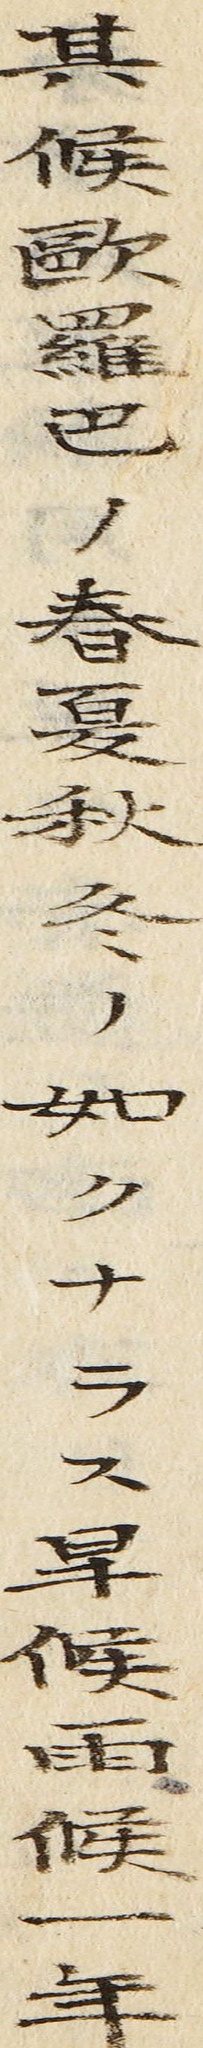其候用欧羅巴ノ春夏秋冬ノ如クナラス旱候雨候一年
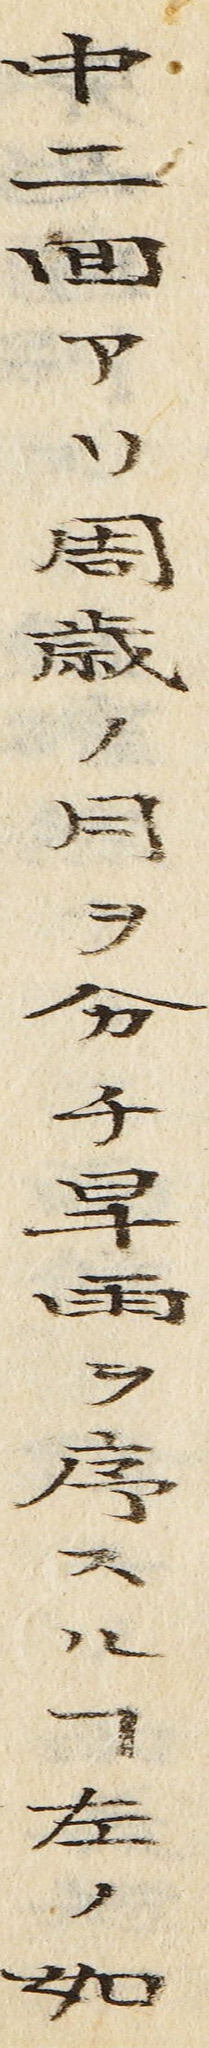中二回アリ周歳ノ月ヲ分チ旱雨ヲ序スルコト左ノ如
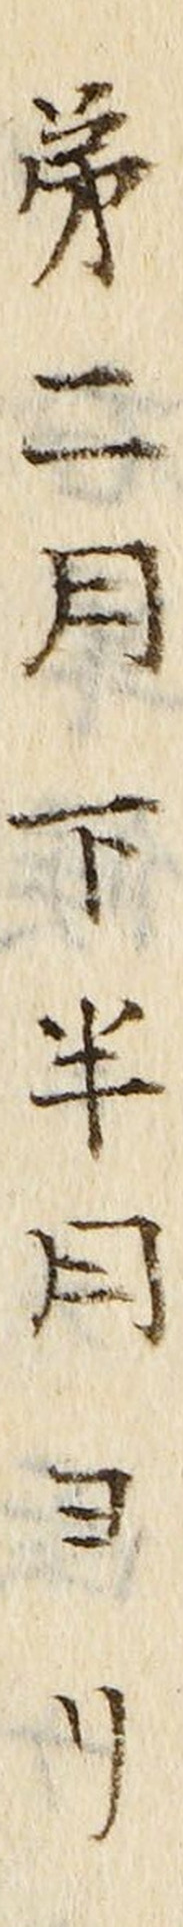第二月下半月ヨリ
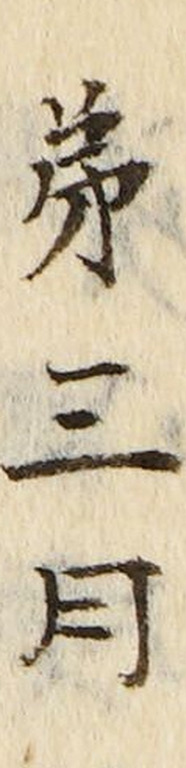第三月
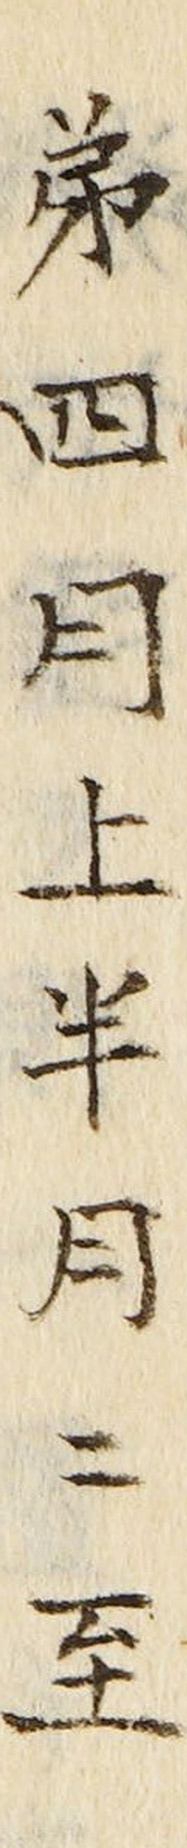第四月上半月ニ至
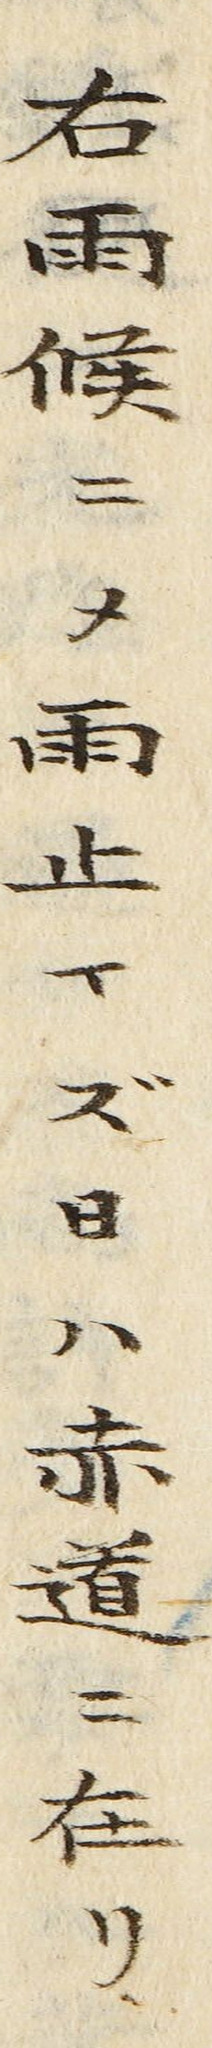右雨候ニシテ雨止マズ日ハ赤道ニ在リ
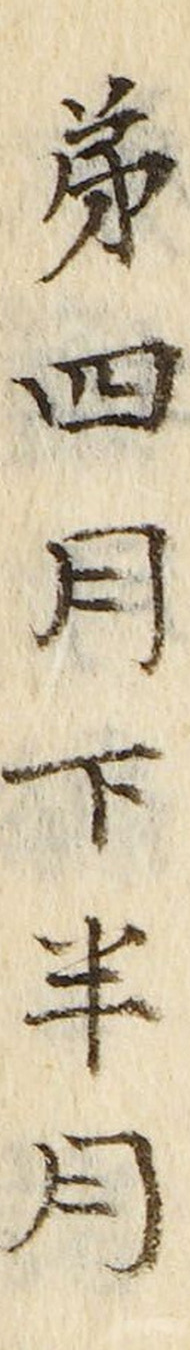第四月下半月

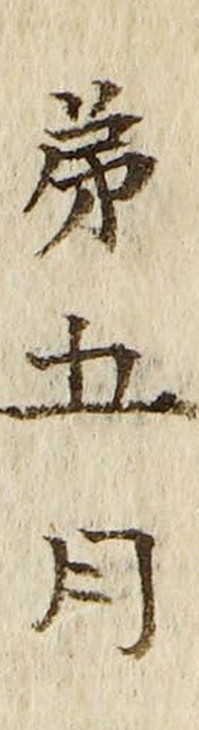第五月
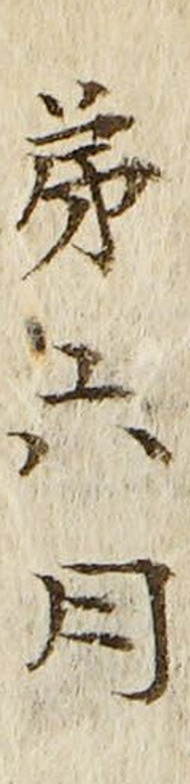第六月
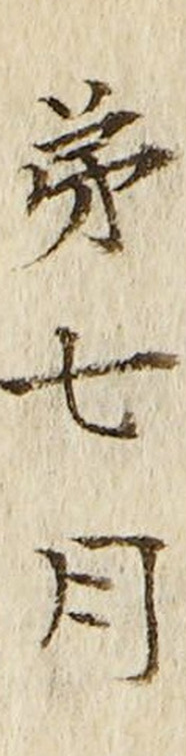第七月
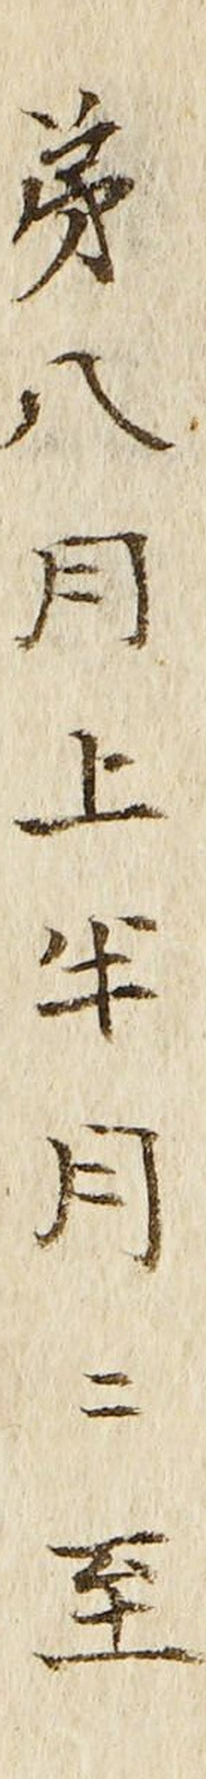第八月上半月ニ至
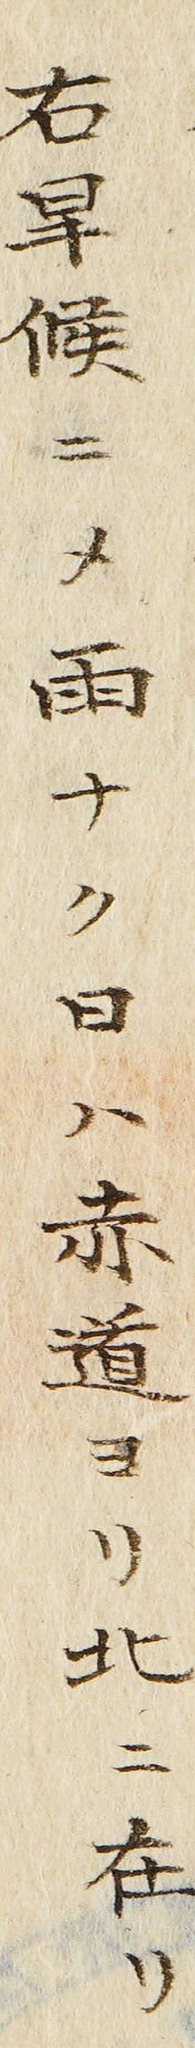右旱候ニシテ雨ナク日ハ赤道ヨリ北ニ在リ
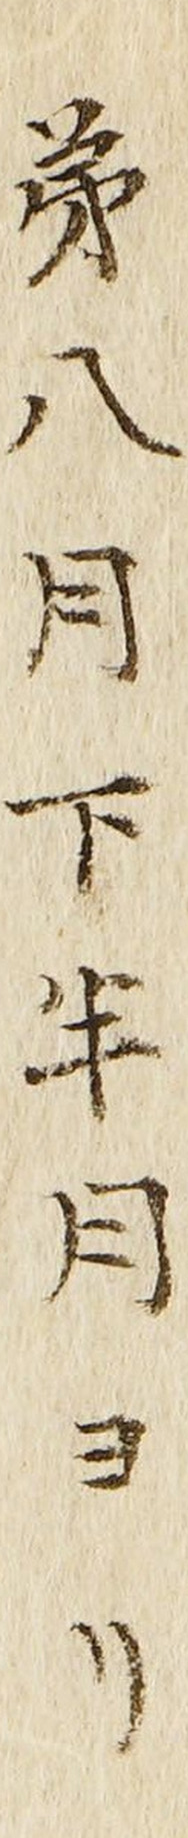第八月下半月ヨリ
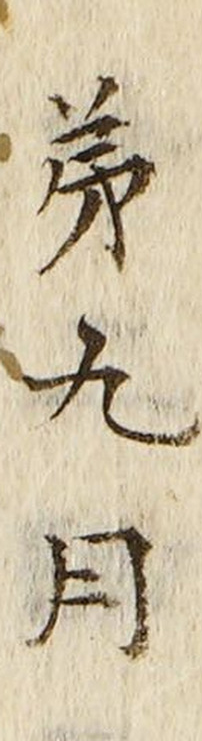第九月
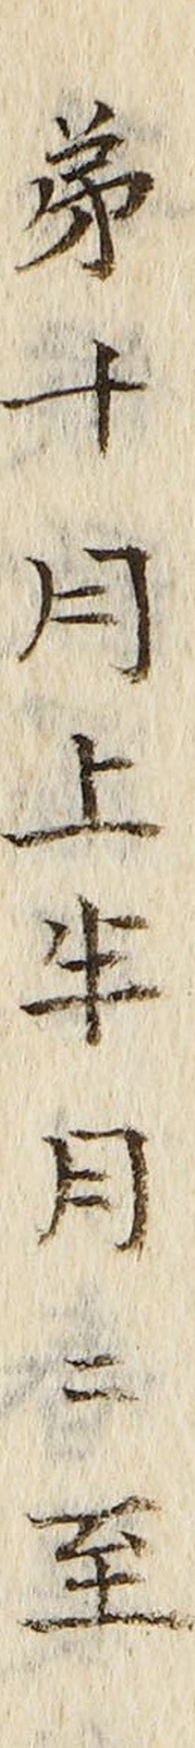第十月上半月ニ至
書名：漂流紀事
